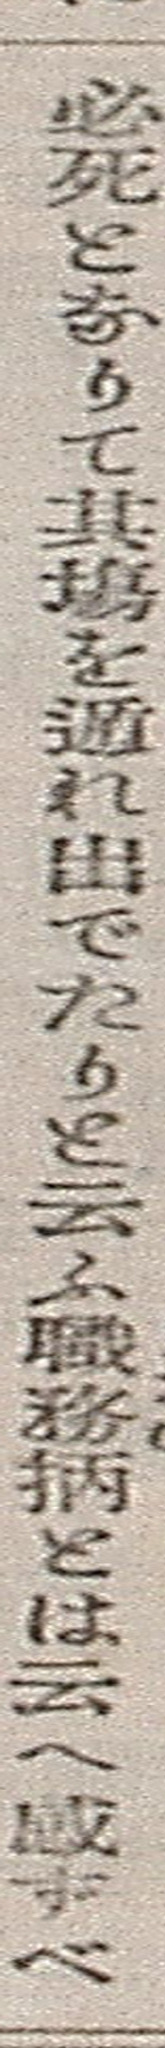必死となりて其場を遁れ出でたりと云ふ職務柄とは云へ感ずべ
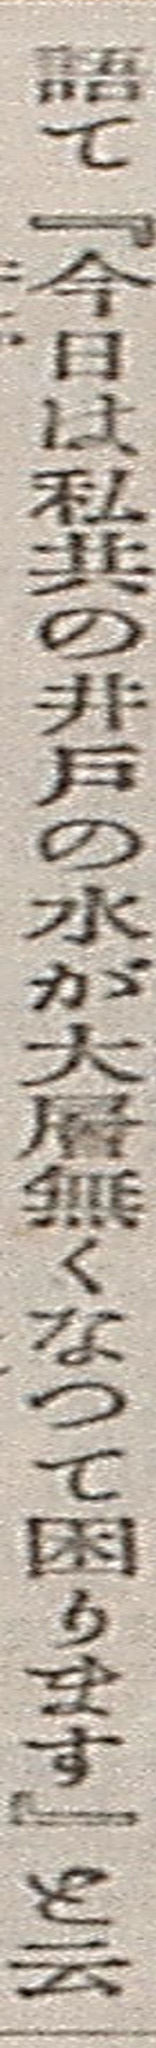語て『今日は私共の井戸の水が大層無くなつて困ります』と云
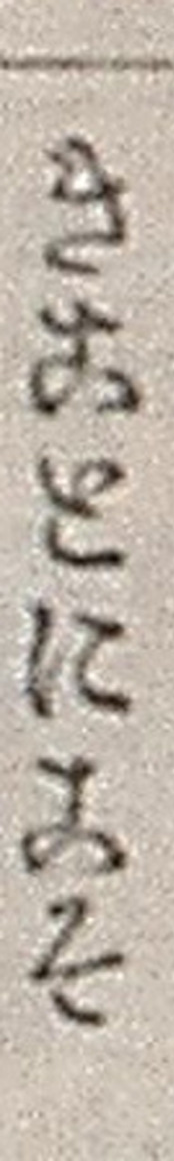きことにこそ
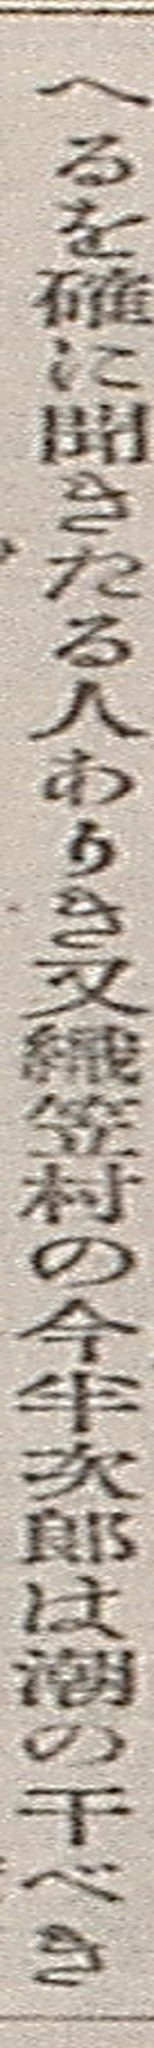へるを確に聞きたる人ありき又織笠村の今半次郎は潮の干べき
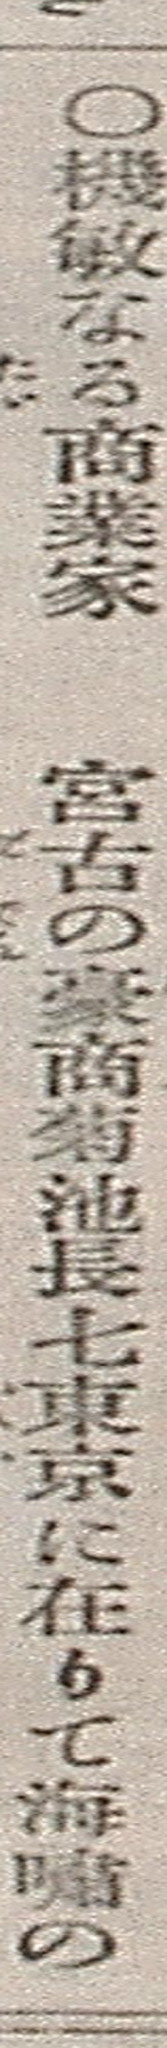○機敏なる商業家宮古の豪商菊池長七東京に在りて海嘯の
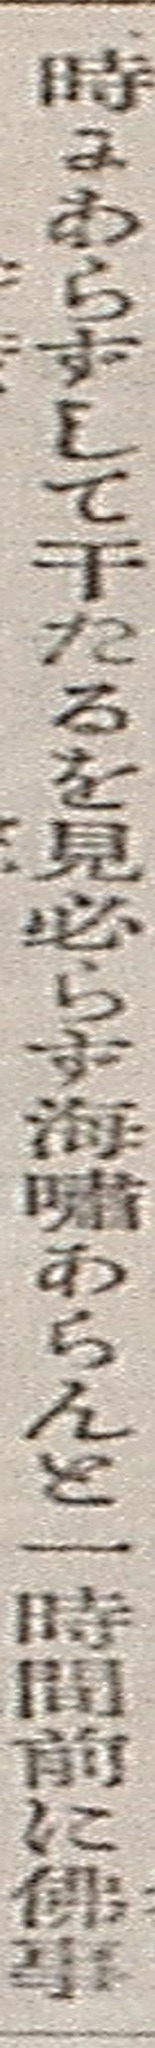時にあらずして干たるを見必らず海嘯あらんと一時間前に仏事
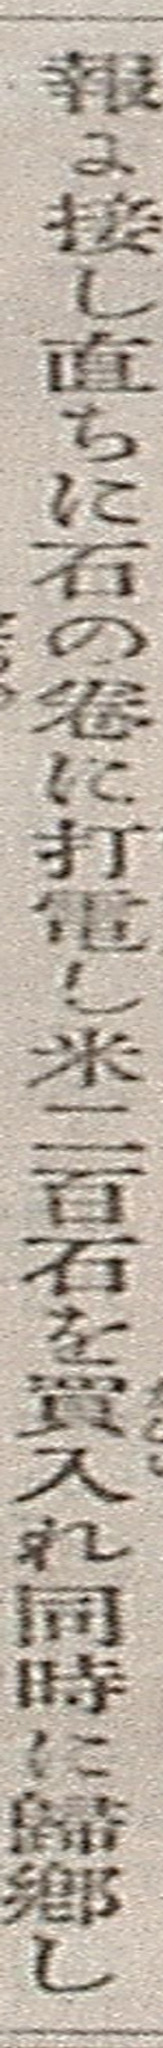報に接し直ちに石の巻に打電し米ニ百石を買入れ同時に帰郷し
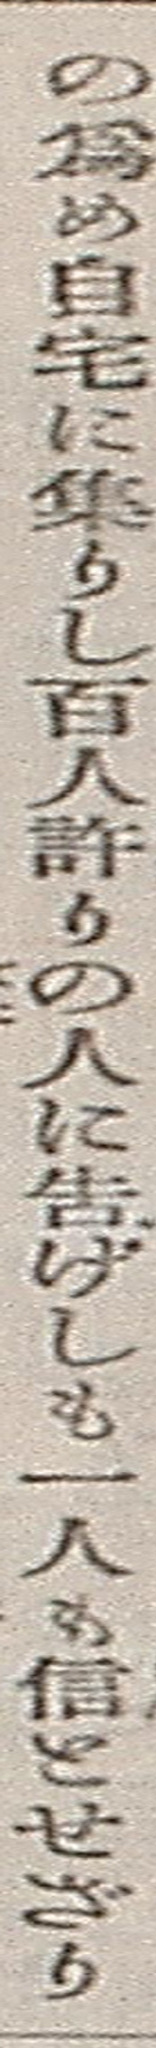の為め自宅に集りし百人許りの人に告げしも一人も信とせざり
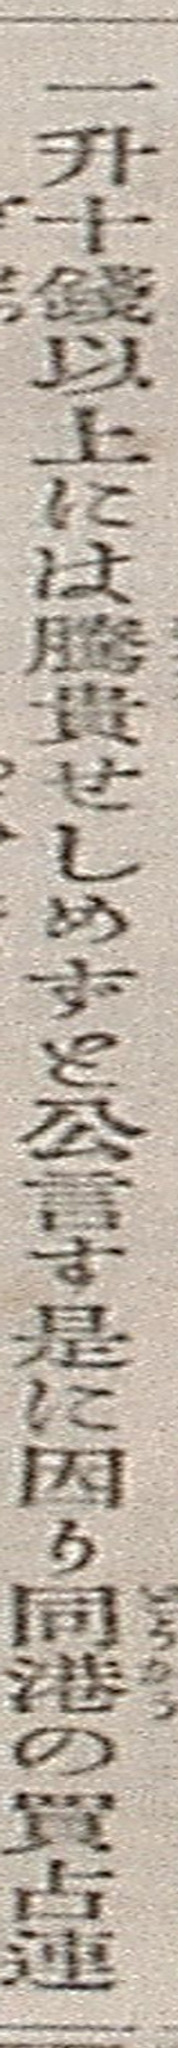一升十銭以上には騰貴せしめずと公言す是に因り同港の買占連
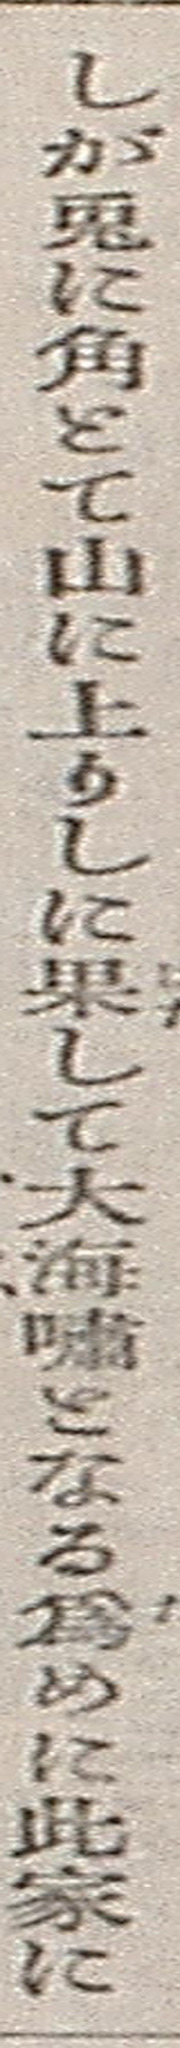しが兎に角とて山に上りしに果して大海嘯となる為めに此家に
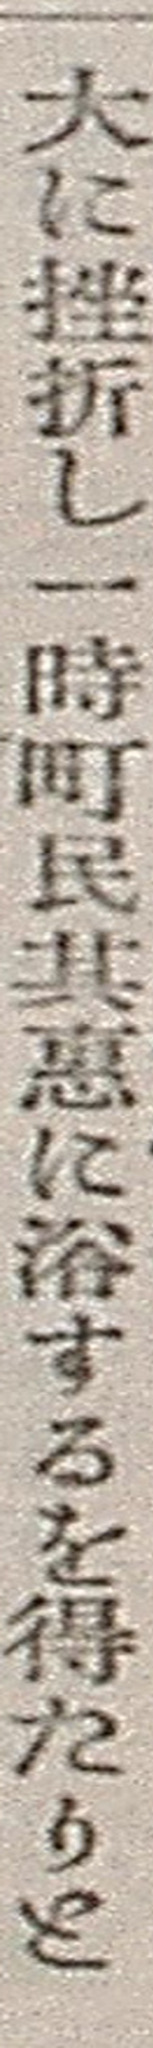大に挫折し一時町民其恵に浴するを得たりと
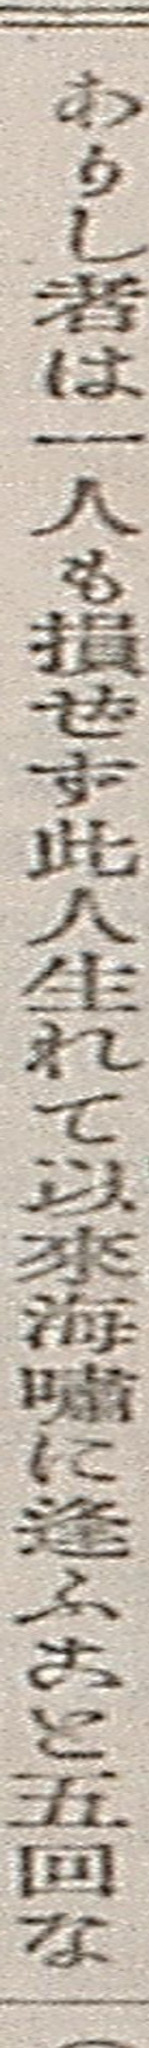ありし者は一人も損ぜず此人生まれて以来海嘯に逢ふこと五回な
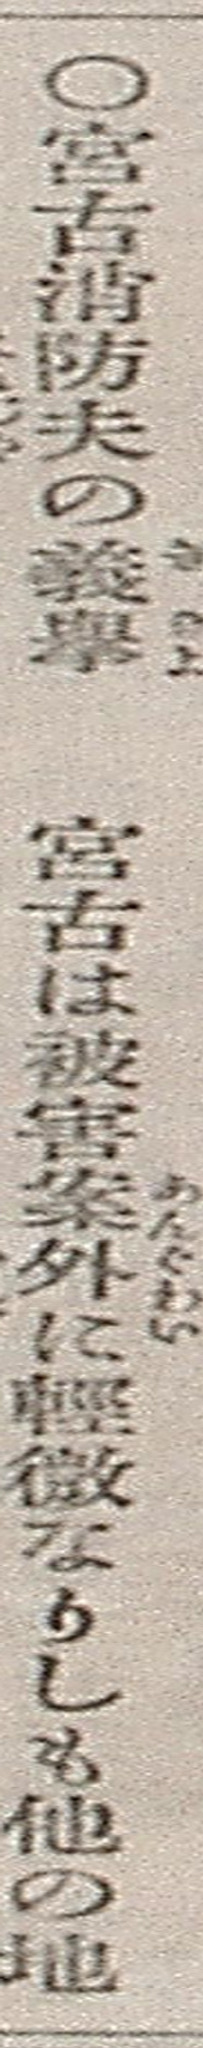○宮古消防夫の義挙宮古は被害案外に軽微なりしも他の地
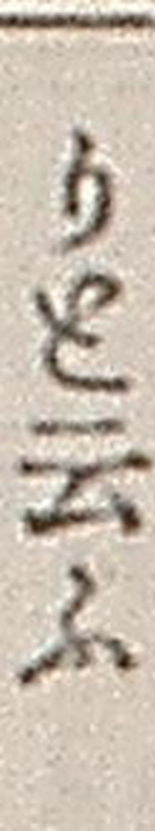りと云ふ
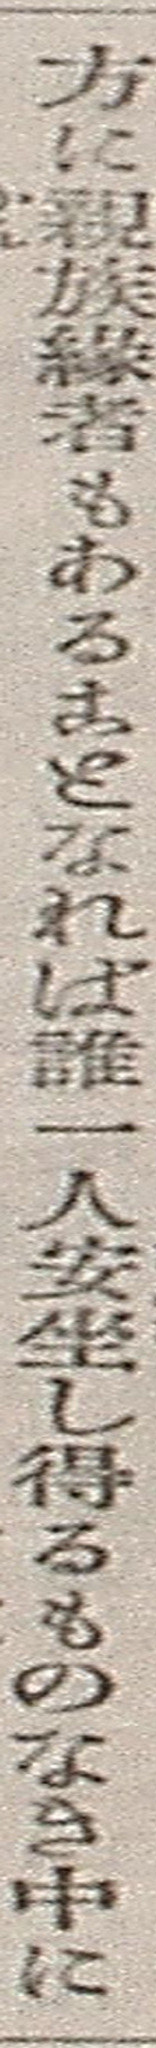方に親族縁者もあることなれば誰一人安坐し得るものなき中に
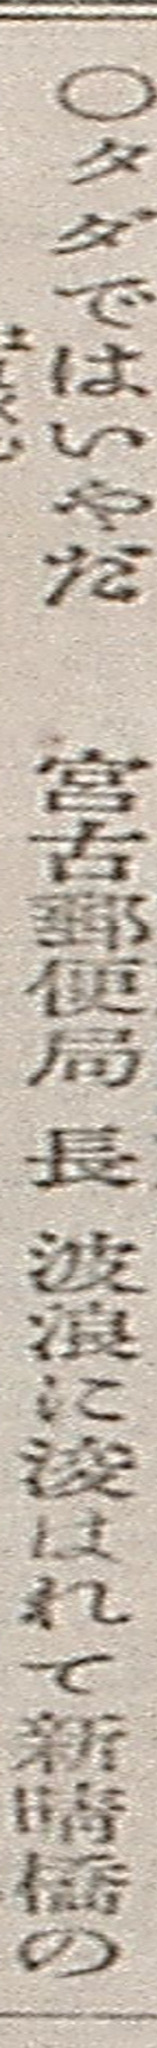○タダではいやだ宮古郵便局長波浪に浚はれて新晴橋の
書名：風俗畫報臨時増刊第百十九號　大海嘯被害録（中）
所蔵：東京大学地震研究所図書室 Earthquake Research Institute Library, The University of Tokyo, JAPAN
